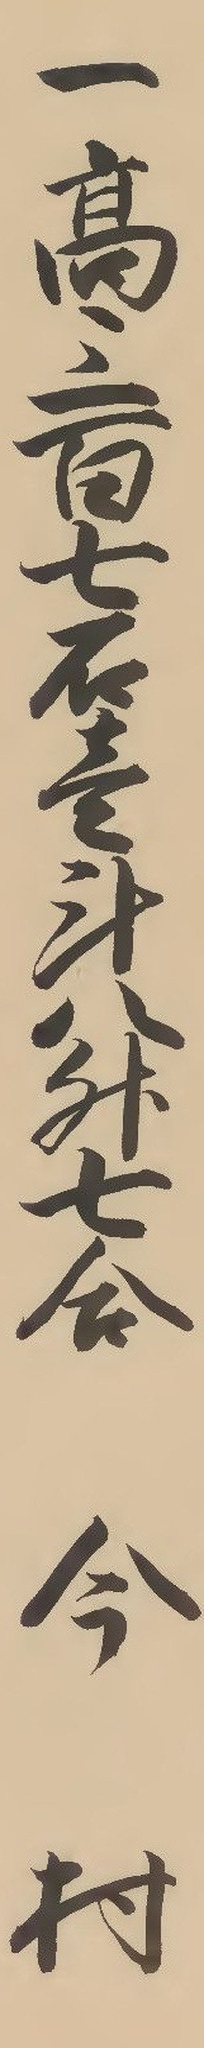一高三百七石壱斗八升七合今村
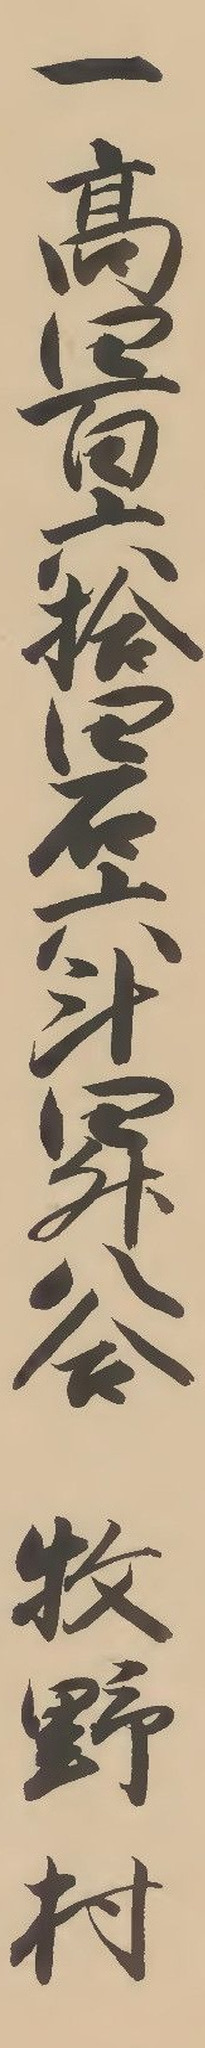一高四百六拾四石六斗四升八合牧野村
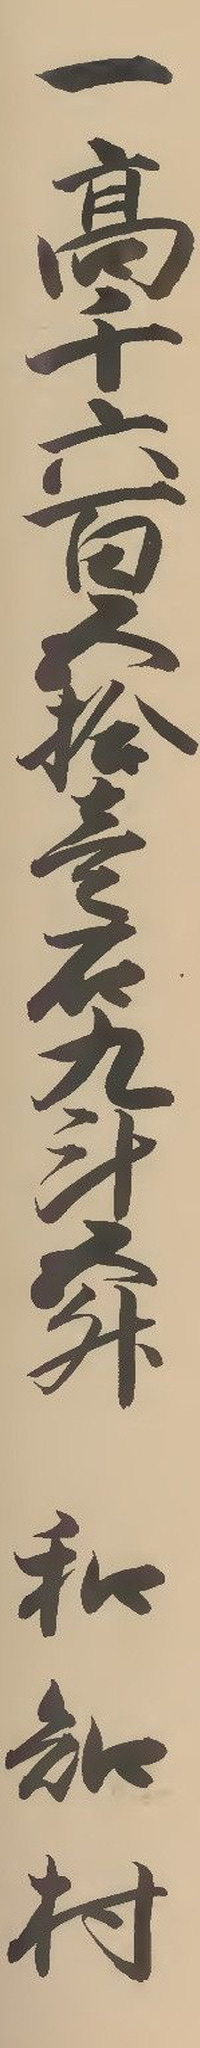一高千六百五拾壱石九斗五升和知村
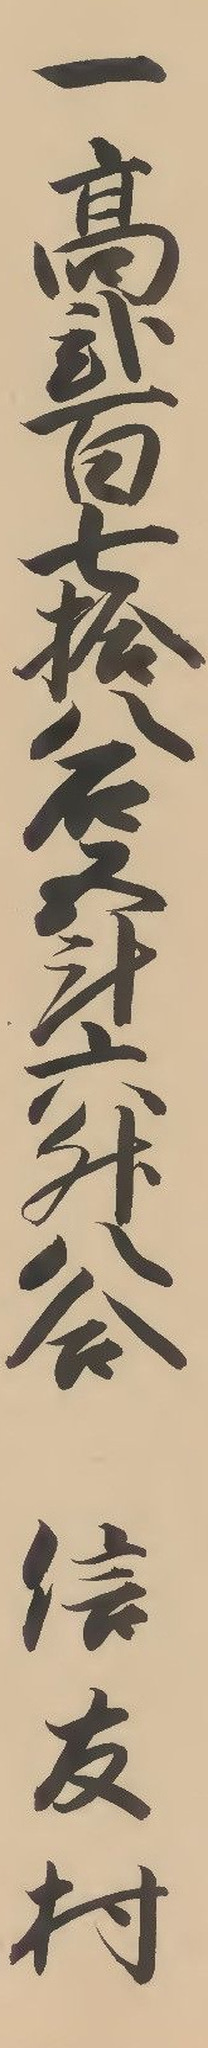一高弐百七拾八石五斗六升八合信友村
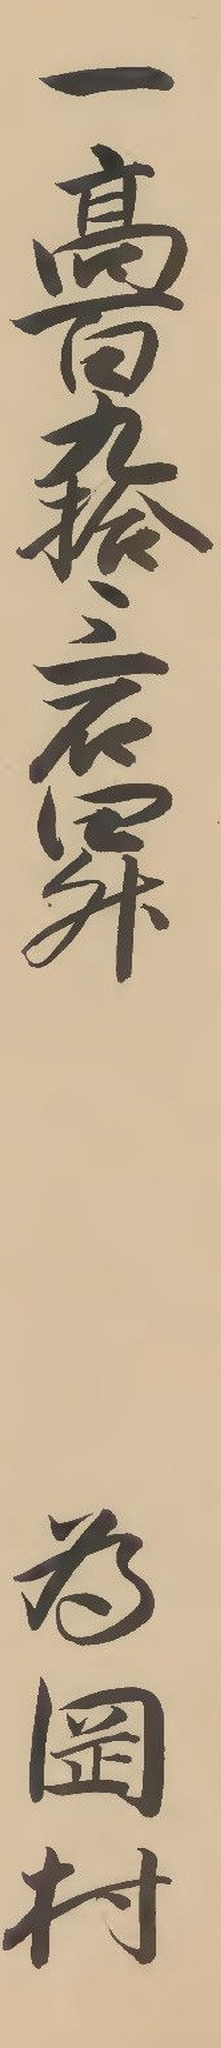一高百九拾三石四升為岡村
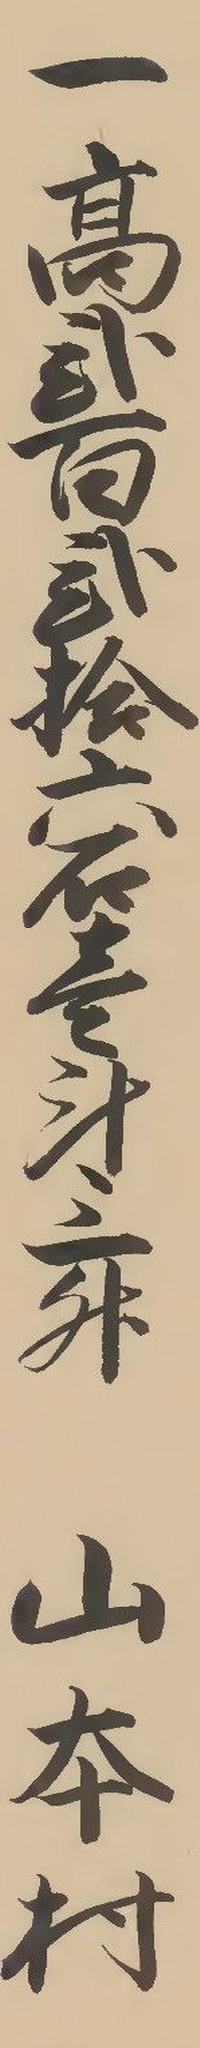一高弐百弐拾六石壱斗三升山本村

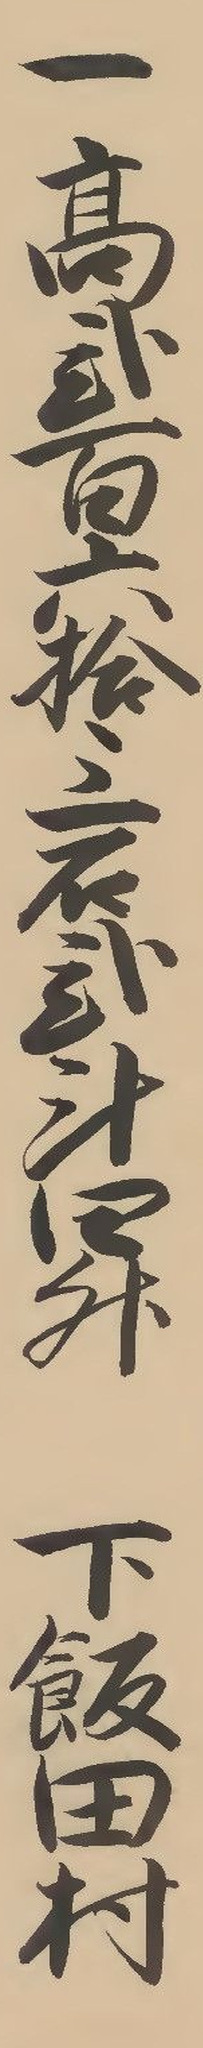一高弐百六拾三石弐斗四升下飯田村
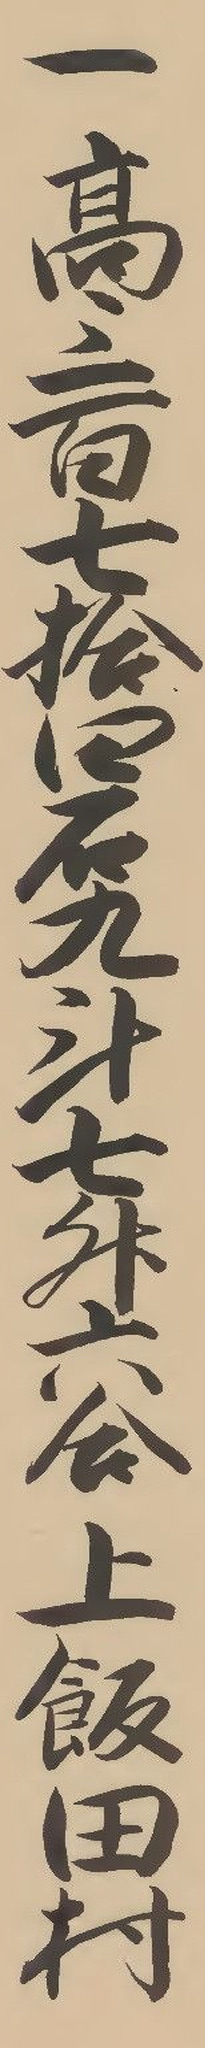一高三百七拾四石九斗七升六合上飯田村
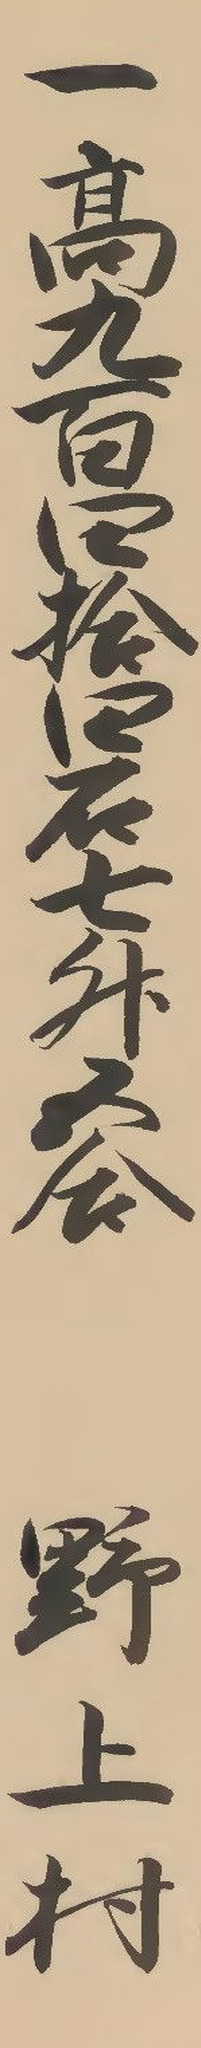一高九百四拾四石七升五合野上村
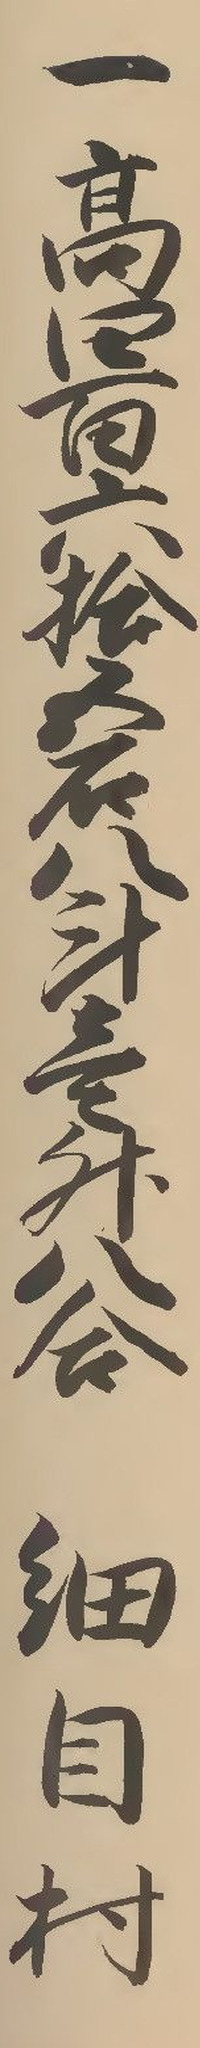一高四百六拾五石八斗壱升八合細目村

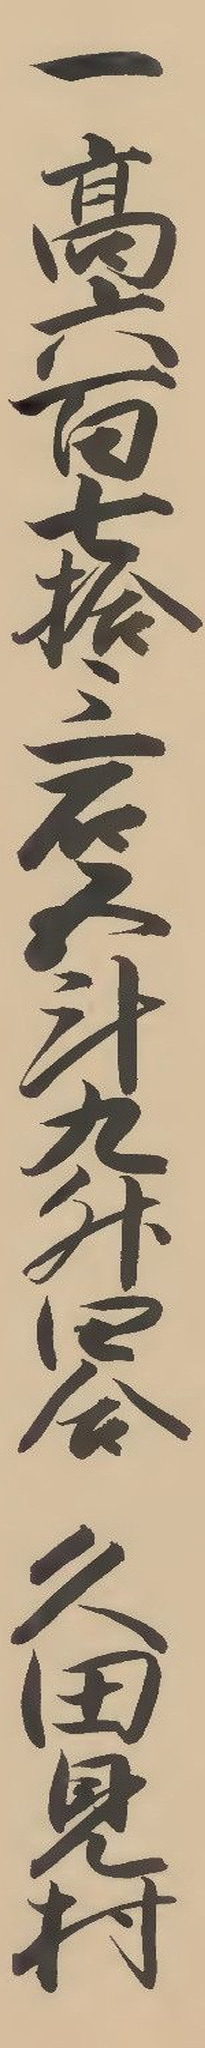一高六百七拾三石五斗九升四合久田見村
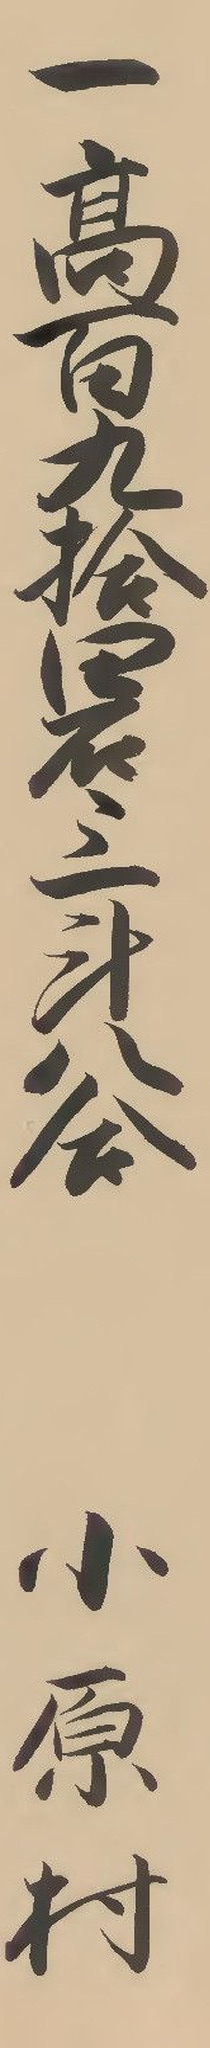一高百九拾四石三斗八合小原村
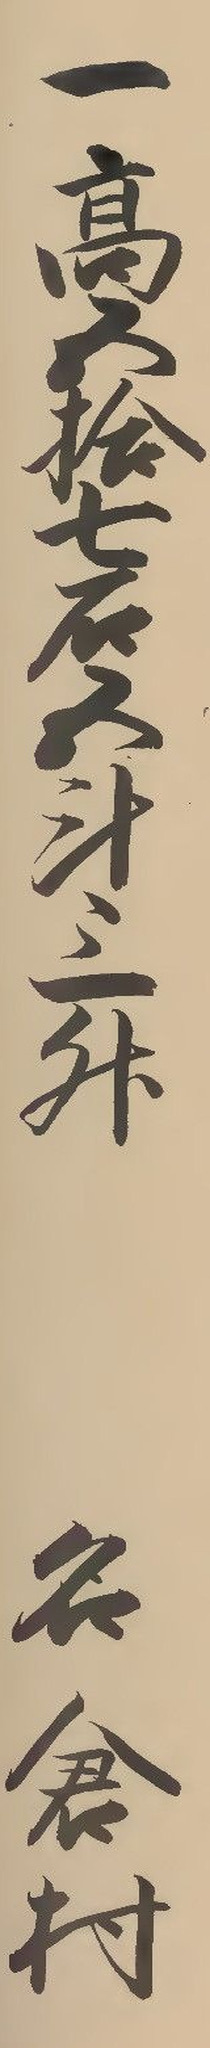一高五拾七石五斗三升名倉村
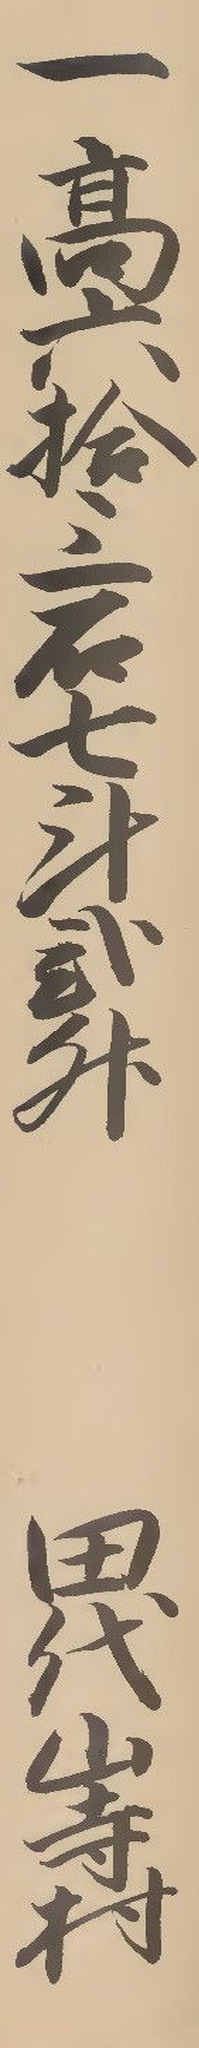一高六拾三石七斗弐升田代山寺村
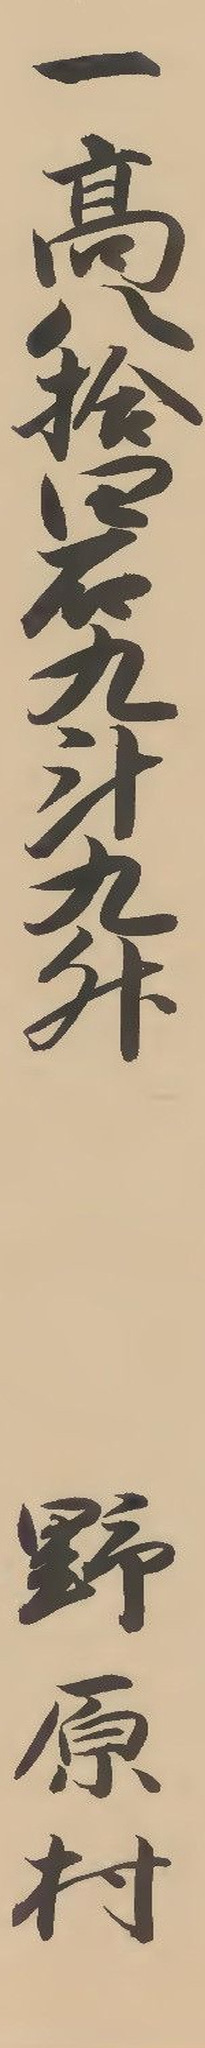一高八拾四石九斗九升野原村
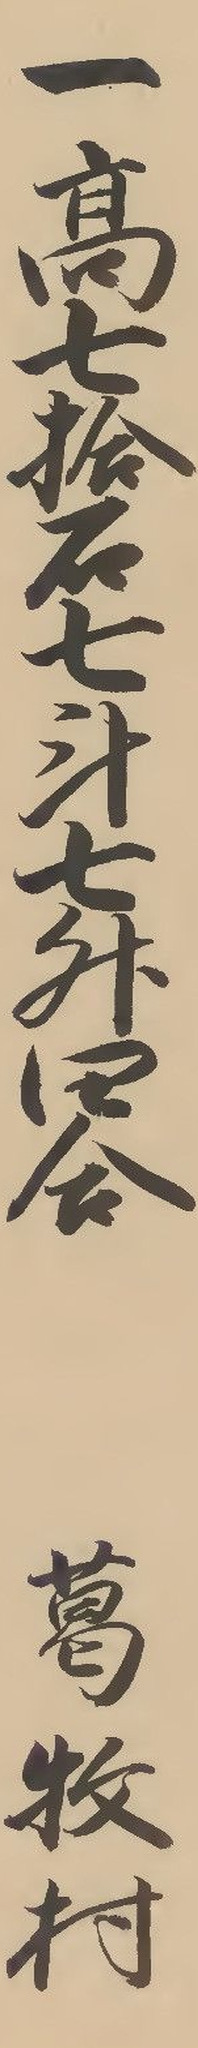一高七拾石七斗七升四合葛牧村
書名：美濃国郷帳
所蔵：国立公文書館 National Archives of Japan
